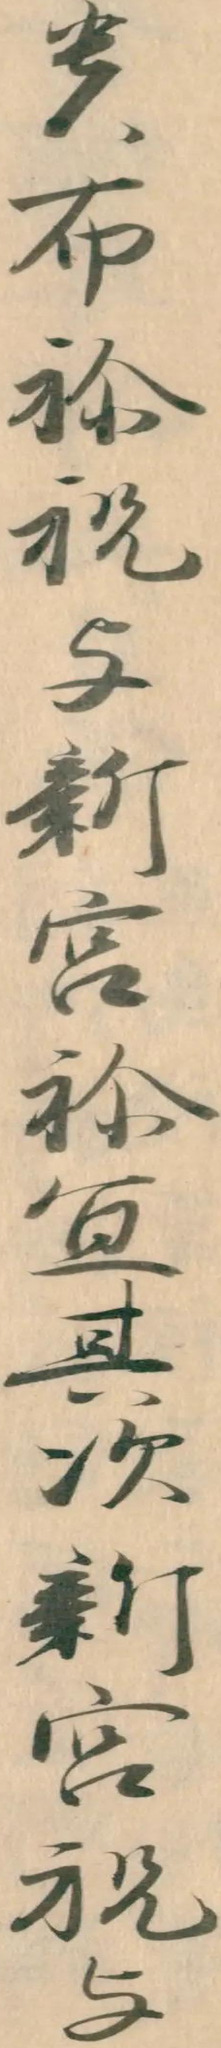貴布禰祝と新宮禰宜其次新宮祝と
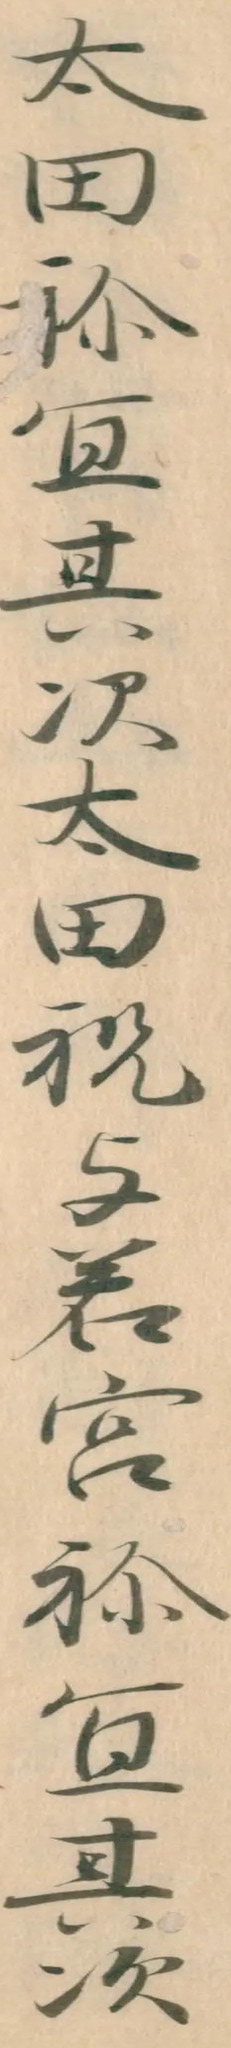太田禰宜其次太田祝と若宮禰宜其次
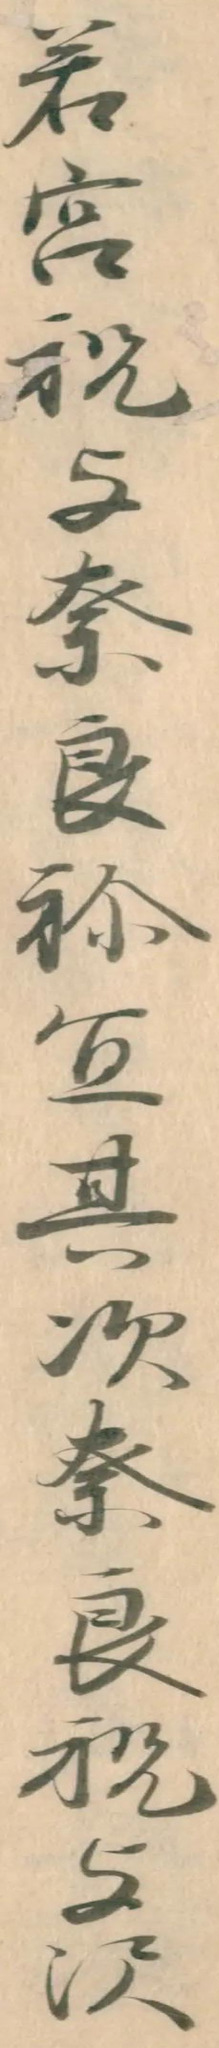若宮祝と奈良禰宜其次奈良祝と沢
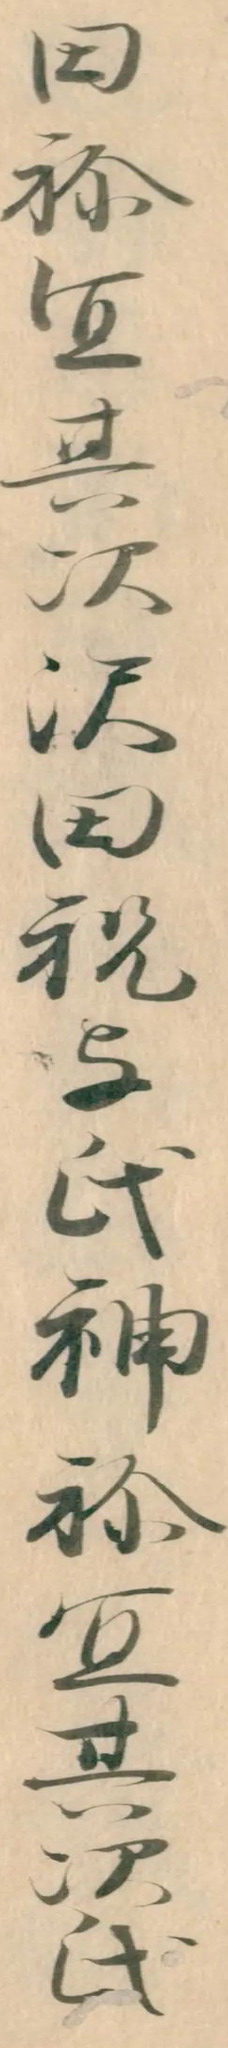田禰宜其次沢田祝と氏神禰宜其次氏
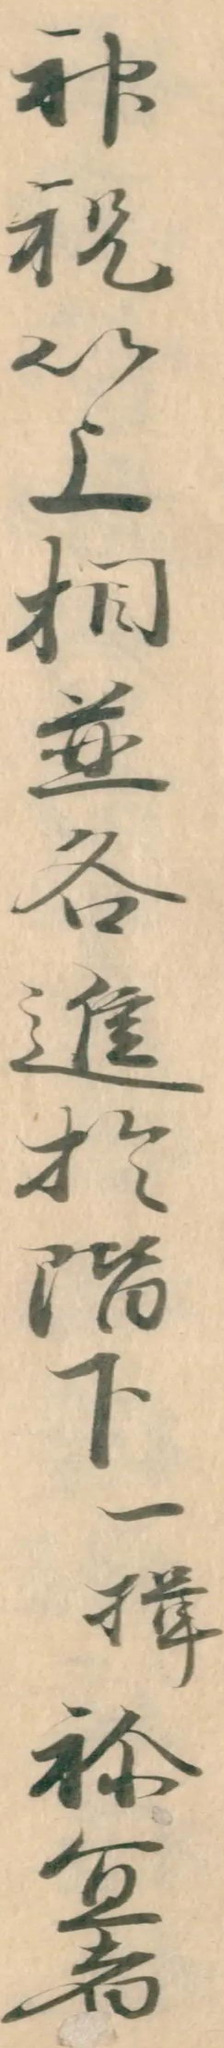神祝以上相並各進於階下一揖禰宜は
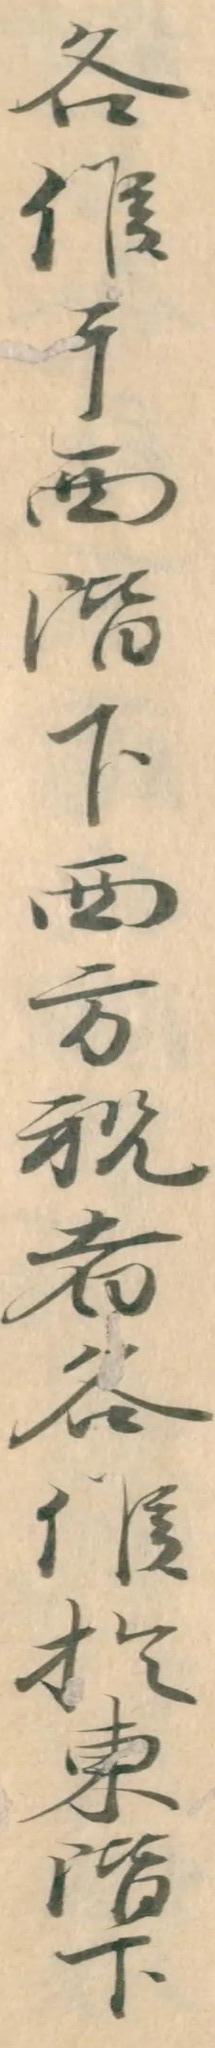各候干西階下西方祝は各候於東階下
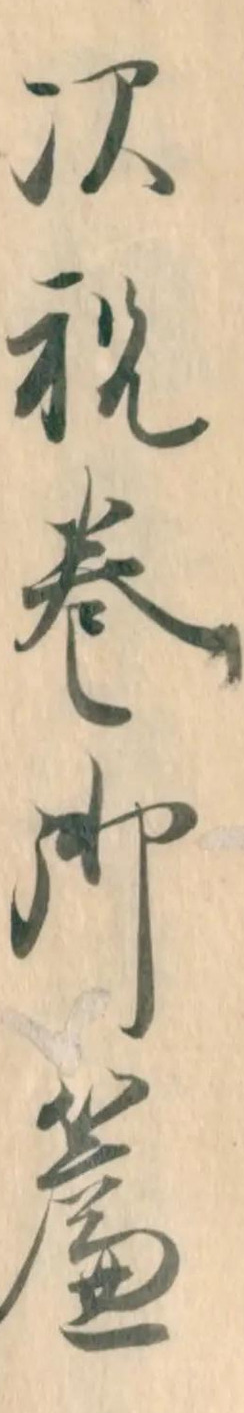次祝巻御簾
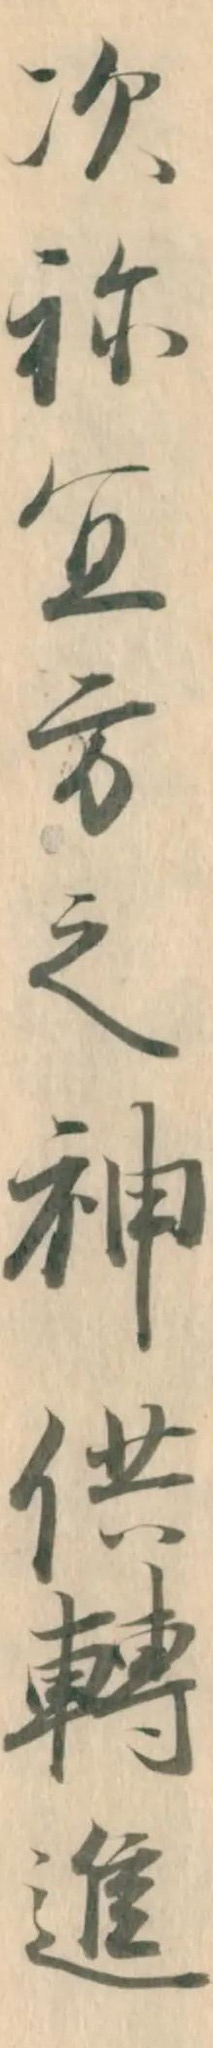次禰宜方之神供転進

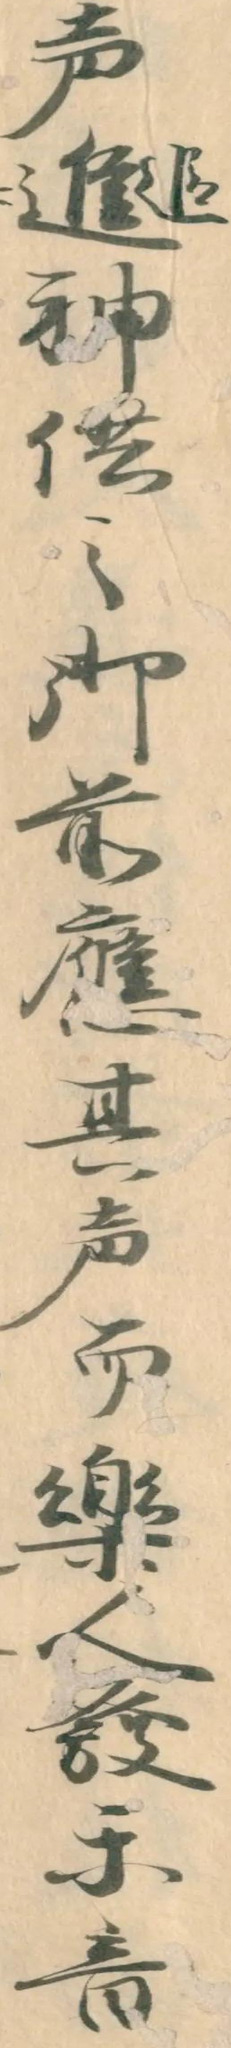声進神供之御前応其声而楽人発楽音
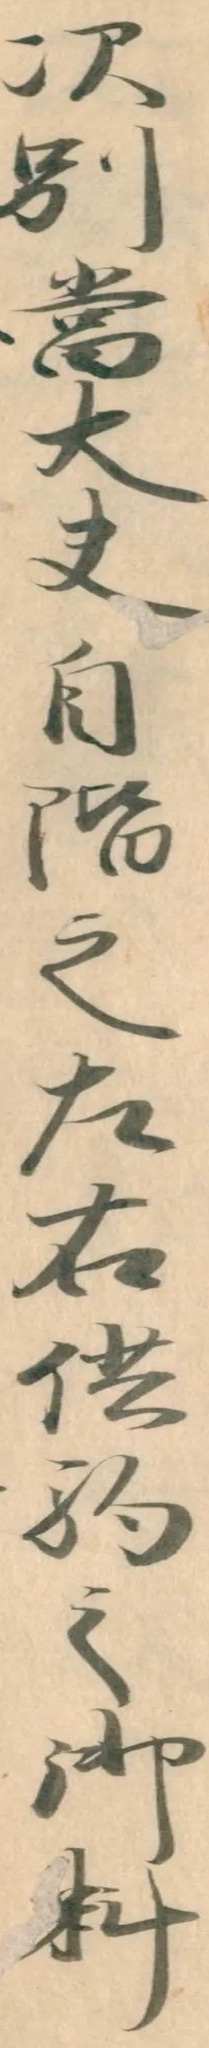次別当大夫自階之左右供駒之御料
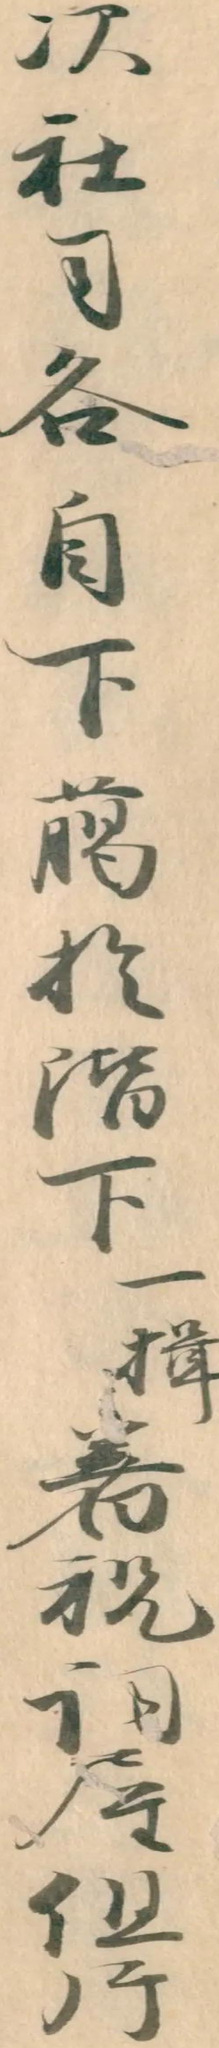次社司各自下﨟於階下一揖着祝詞座但片
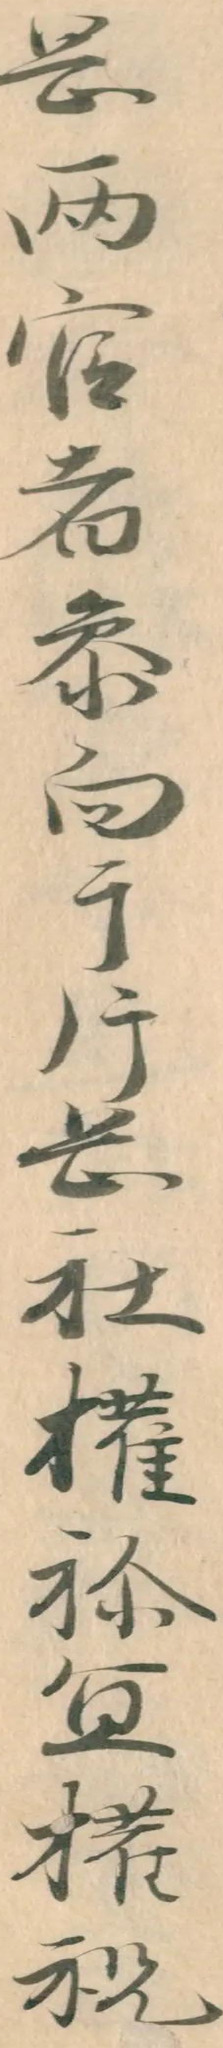岡両官は参向于片岡社権禰宜権祝
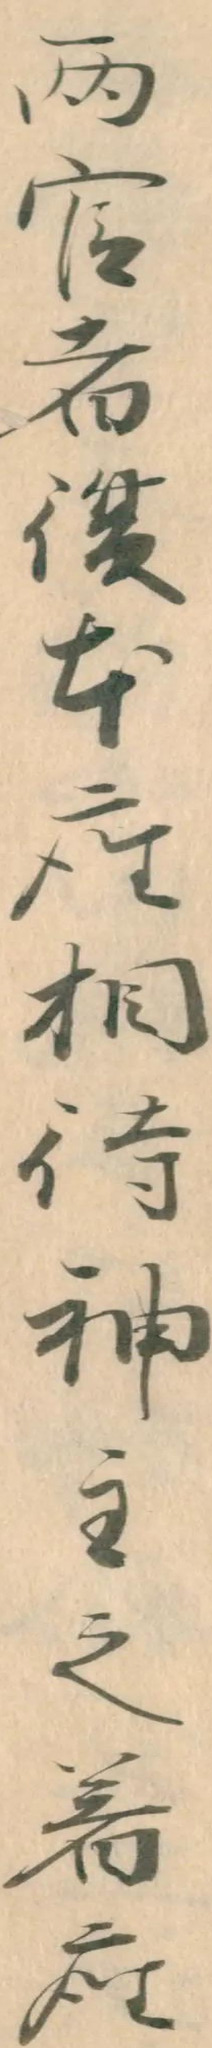両官は復本座相待神主之着座
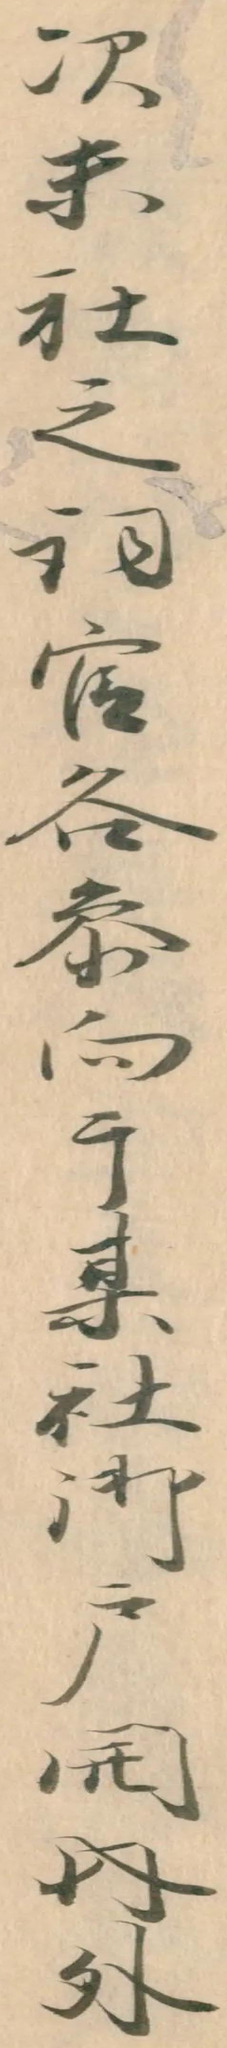次末社之詞官各参向于某社御戸開内外
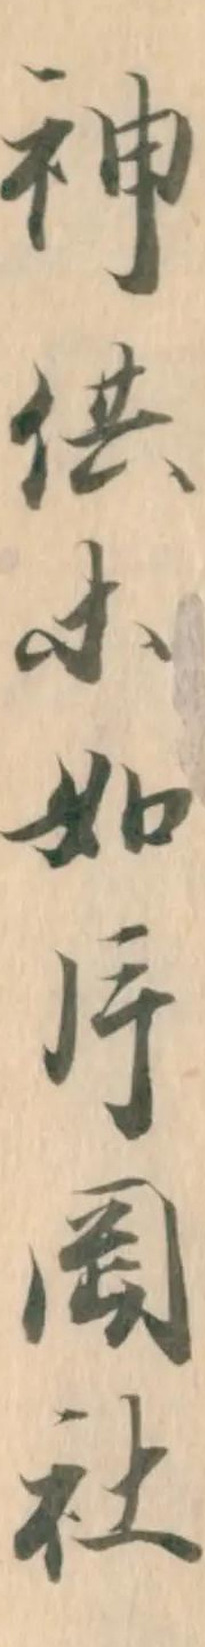神供等如片岡社
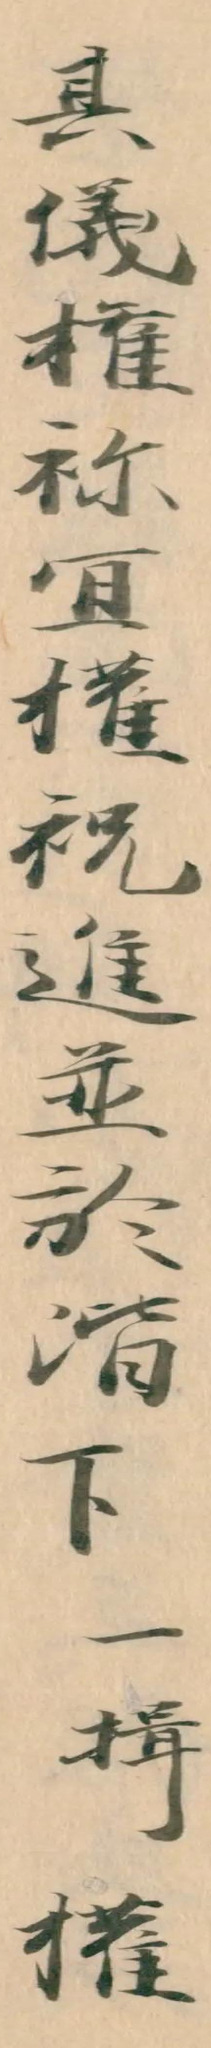其儀権禰宜権祝進並於階下一揖権
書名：賀茂太神宮年中神事略次第
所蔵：国立国会図書館 National Diet Library, JAPAN
